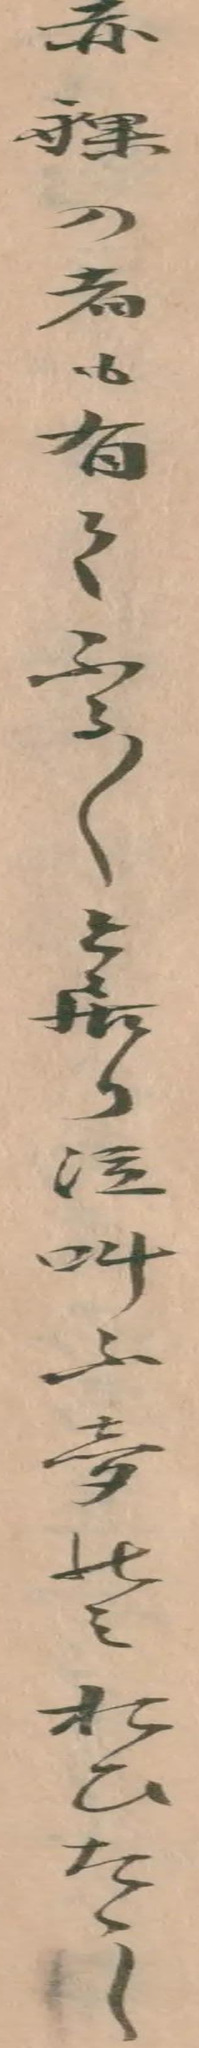赤裸の者も有てふへ〳〵と居り泣叫ふ声のミおたゝし
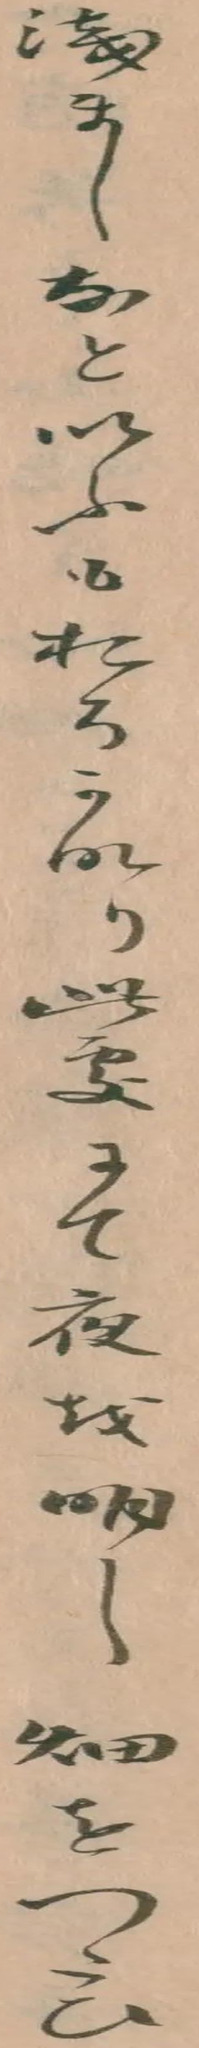浅ましなといふもおろかなり此処にて夜を明し畑をつた
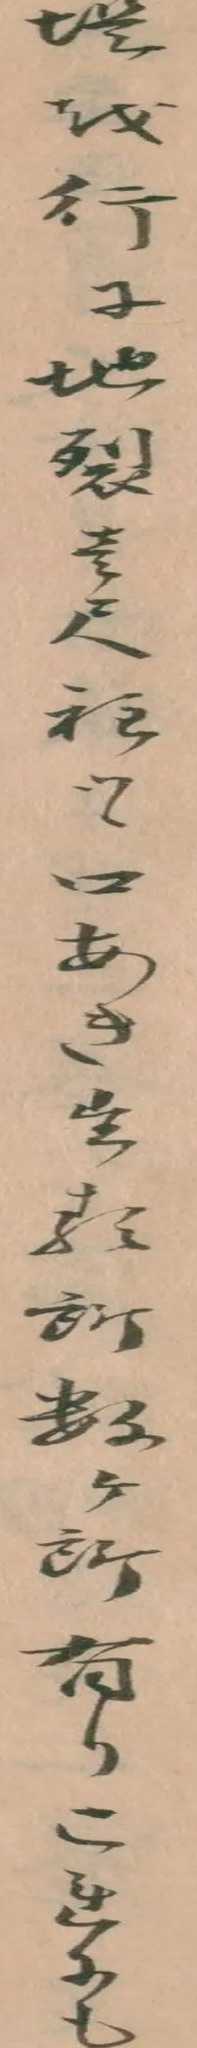ひ堤を行に地さ裂壱尺程つゝ口あきたる所数ヶ所有りこれにも
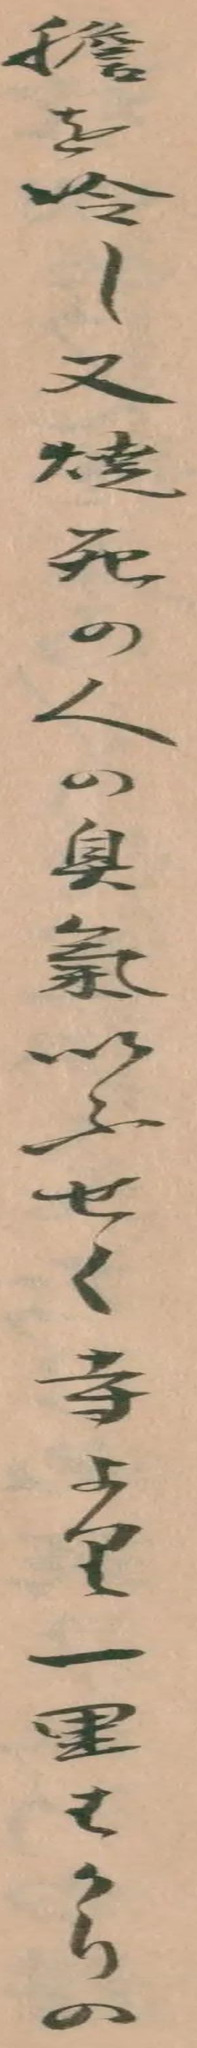膽を冷し又焼死の人の臭気いぶせく寺より一里はかりの
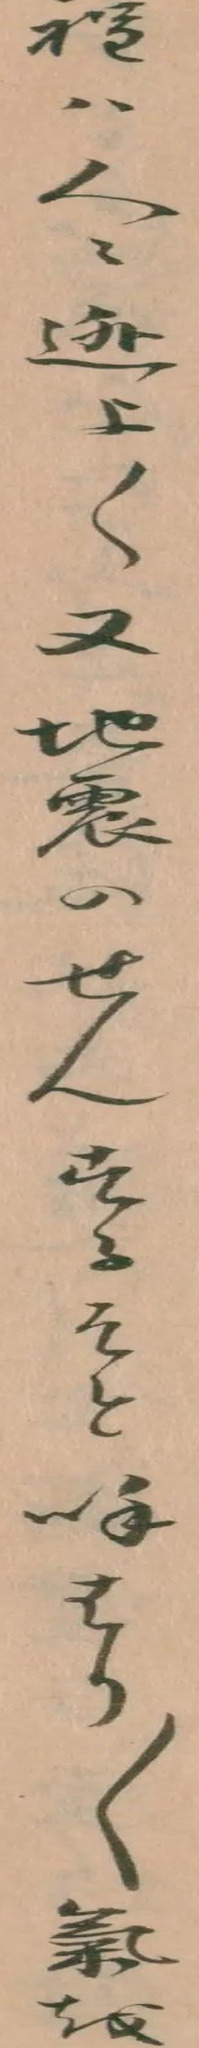程ハ人々逃よ〳〵また地震のせんするそと呼はり〳〵気を
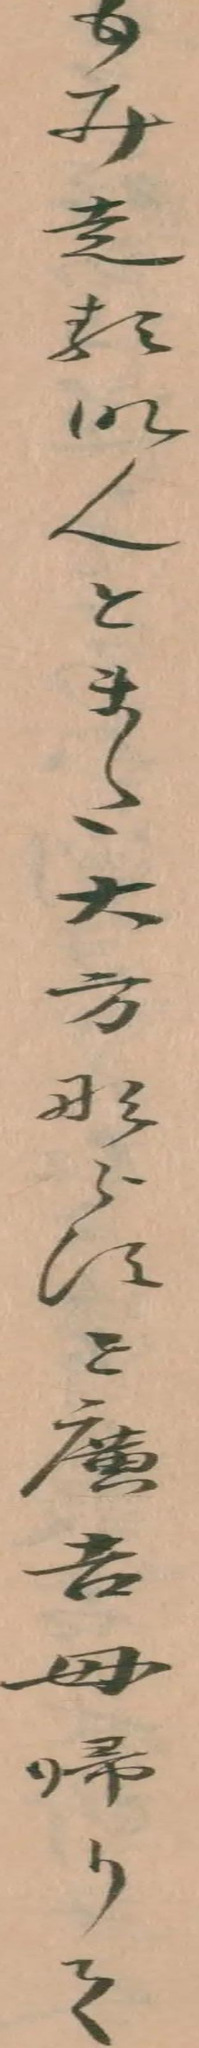もみ走るなんとまた大方ならすと広吉母帰りて
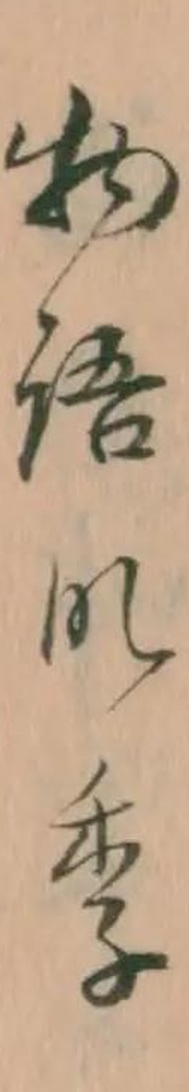物語なり
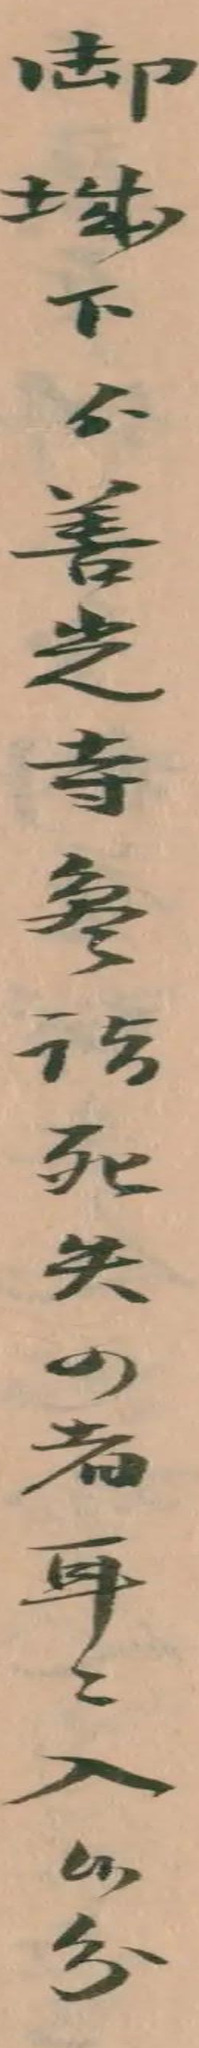御城下より善光寺参詣死失の者耳に入候分
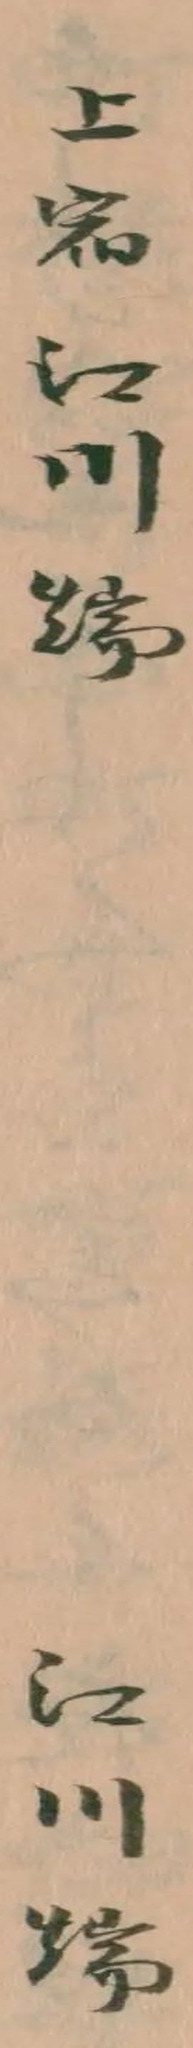上宿江川端江川端
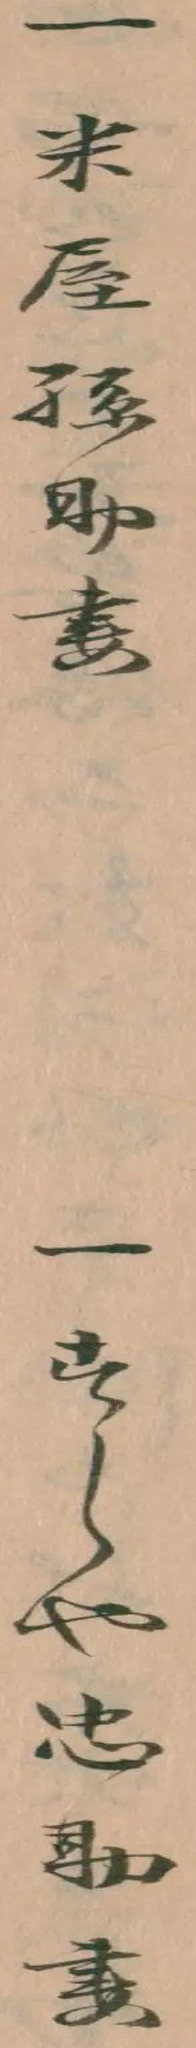一米屋孫助妻一すしや忠助妻
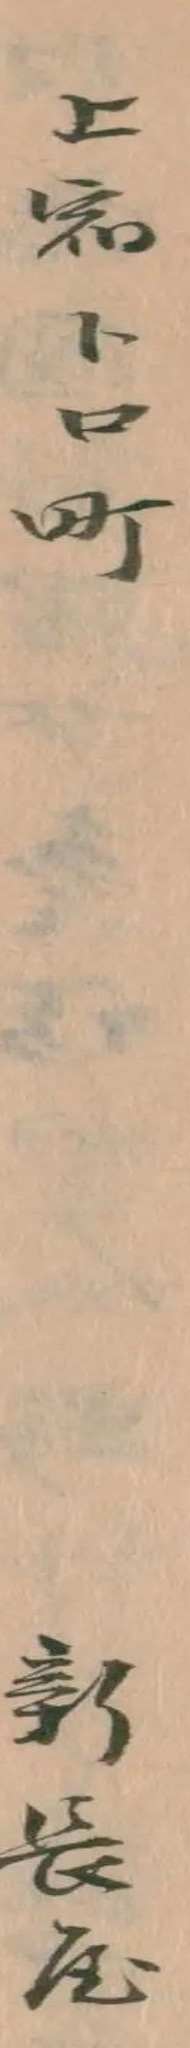上宿ドロ丁新長屋
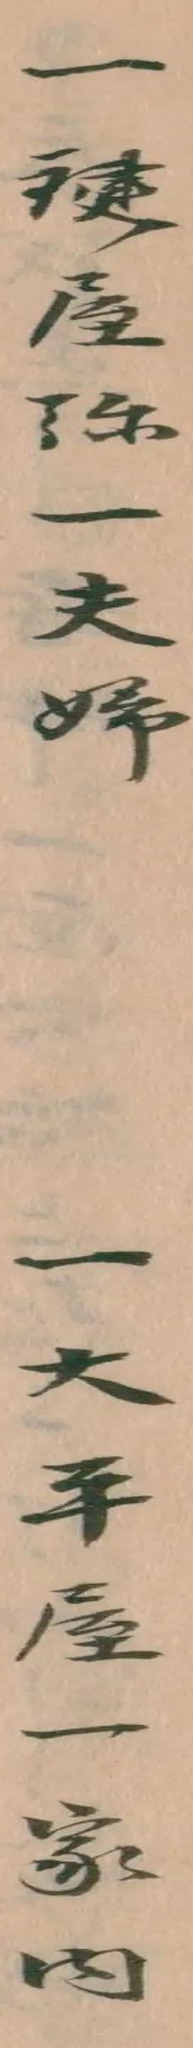一鍵屋弥一夫婦一大平屋家内
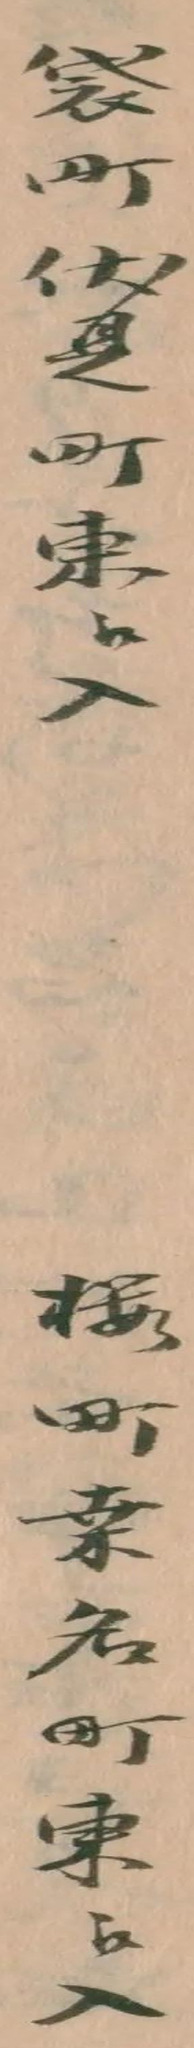袋丁伏見丁東江入桜丁桑名町東へ入
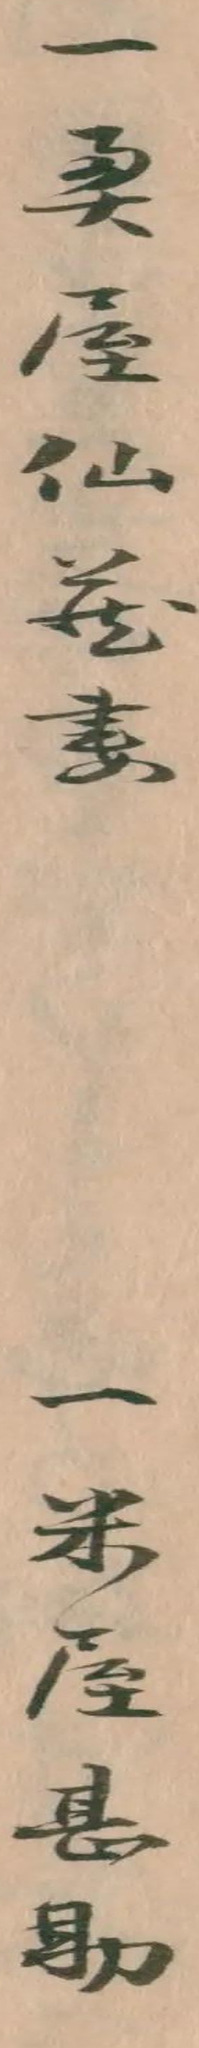一畳屋仙蔵妻一米屋甚助
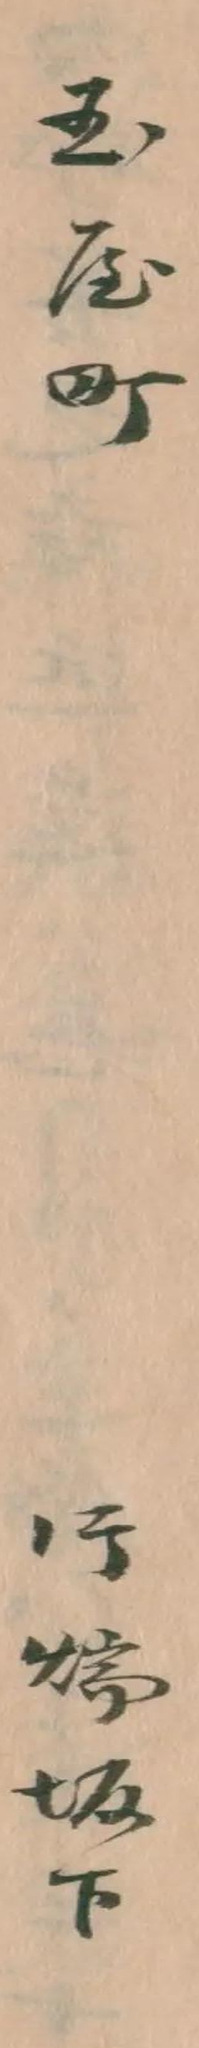玉屋町片端坂下
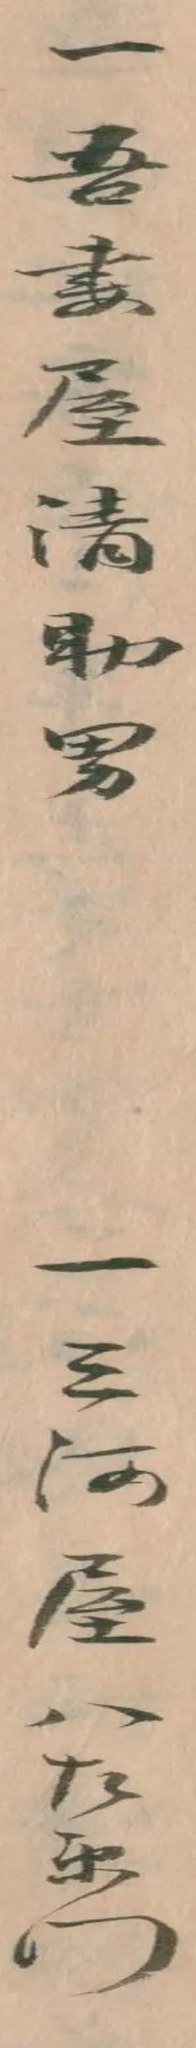一吾妻屋清助男一三河屋八左衛門
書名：地災撮要. 巻3(地震之部)-巻4(噴火之部)
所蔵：国立国会図書館 National Diet Library, JAPAN
